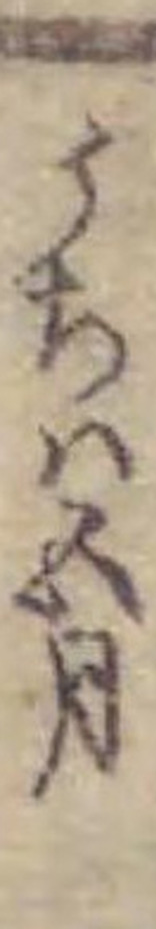うちは五月
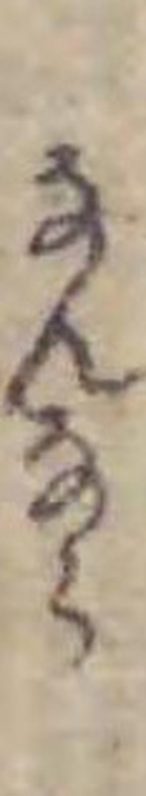なんなら
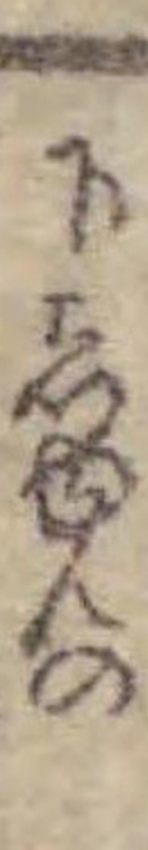下しゆんの
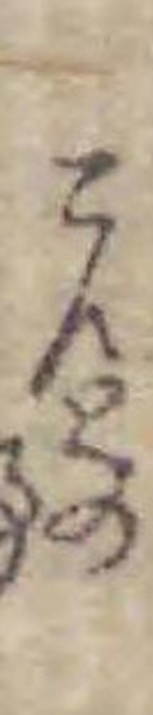こんとの
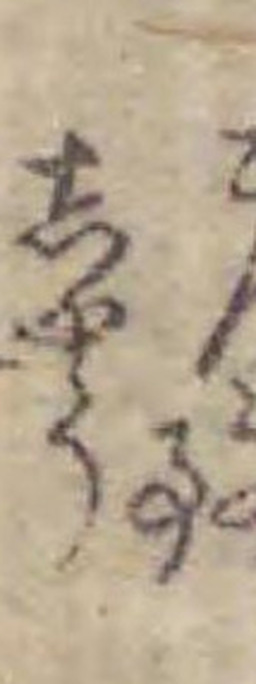しやう
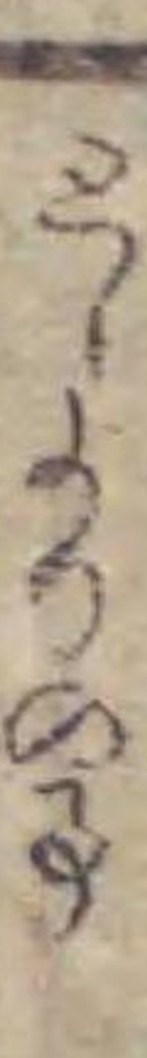としよりの事
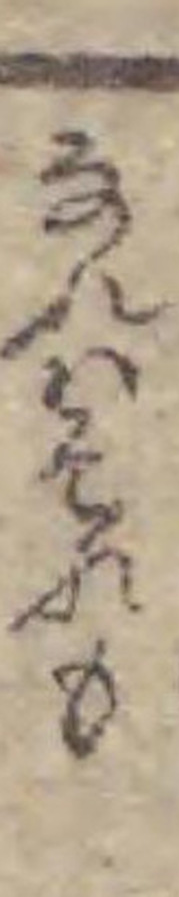なれはそれも
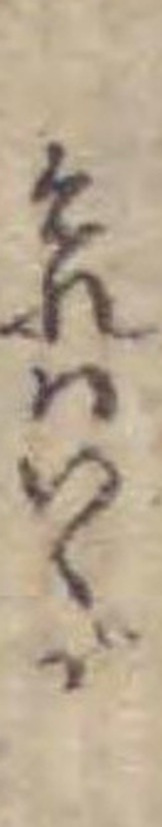それはいゝが
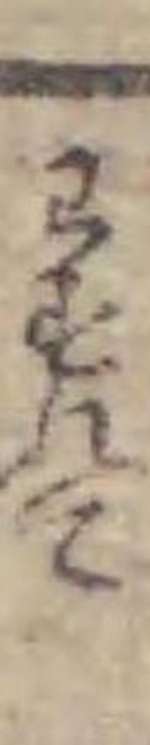わすれて
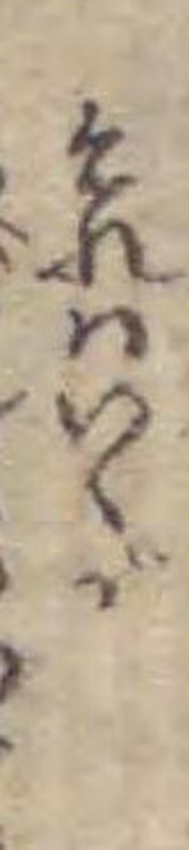それはいゝが
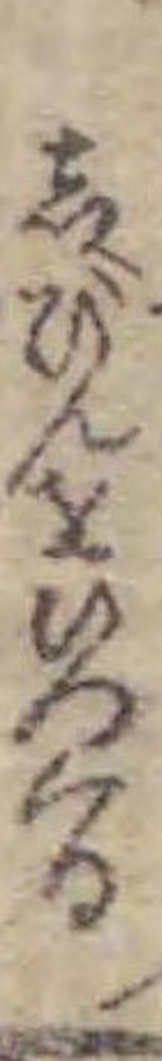しびんをひつくる
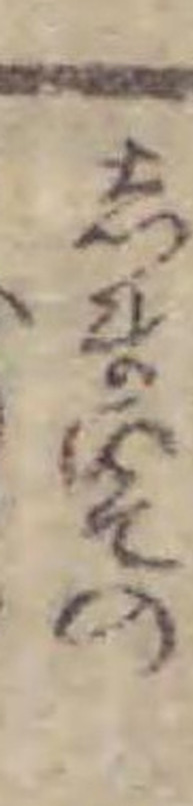しまいその
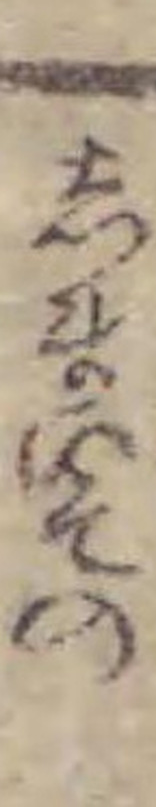しまいその
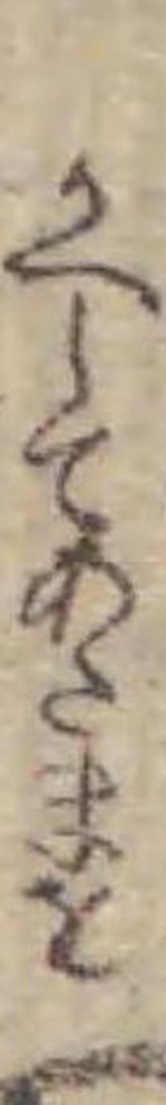かへしてあたまを
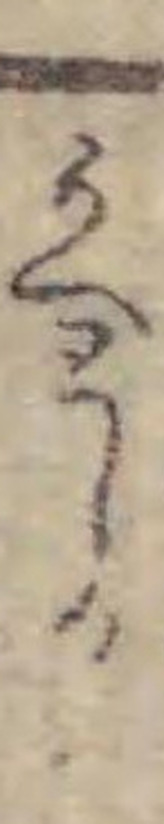うへとしか
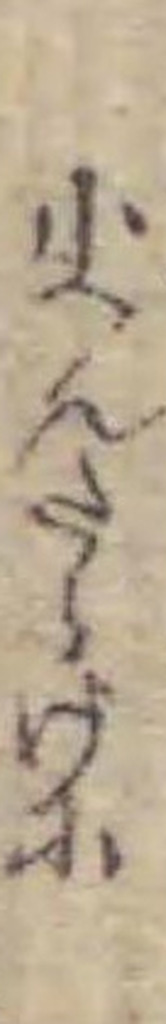小へんたらけに
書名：年寄之冷水曽我 : 3巻
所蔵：国立国会図書館 National Diet Library, JAPAN
